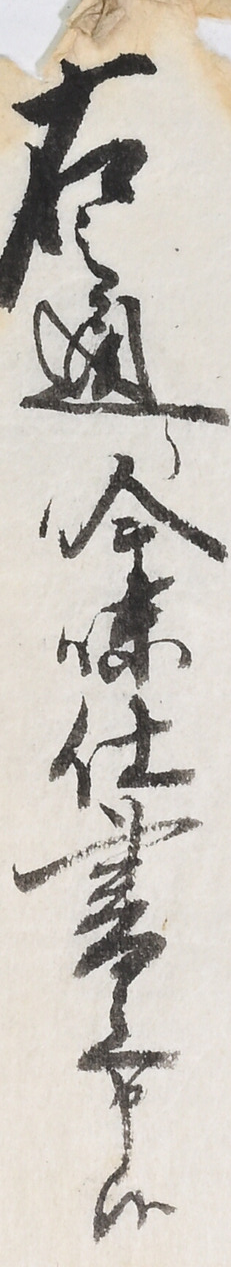右之通り吟味仕書上申候
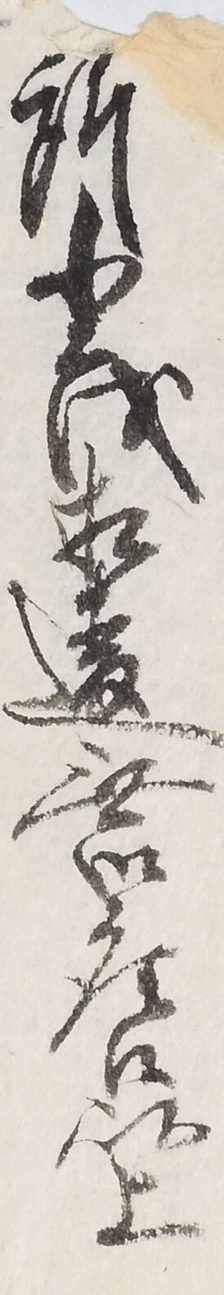所少も相違無御座候以上
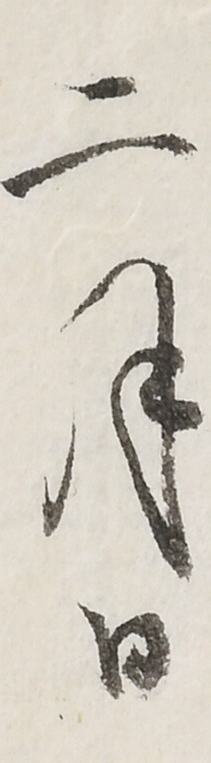二月日
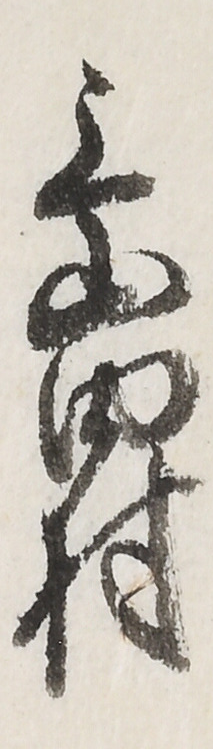上山田村
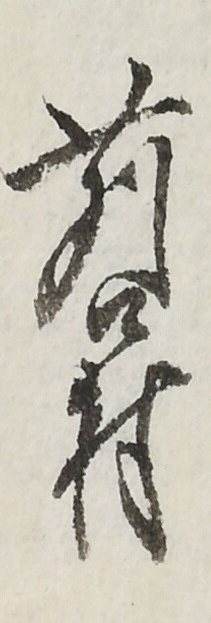荊口村
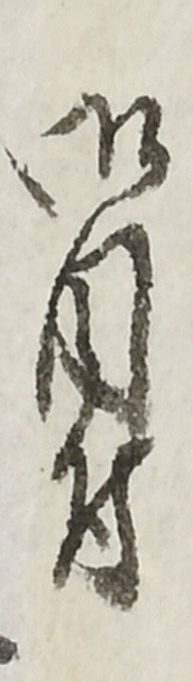御目付
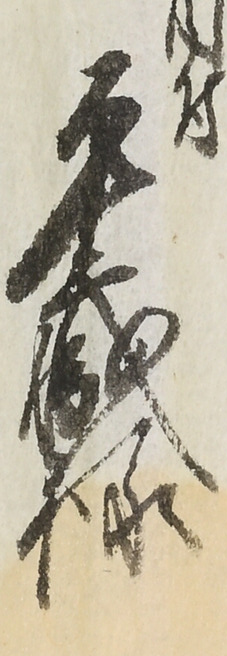平蔵様
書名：文久二壬戌年二月日他国石切稼書上帳
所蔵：伊那市立高遠町図書館・合同会社AMANE
